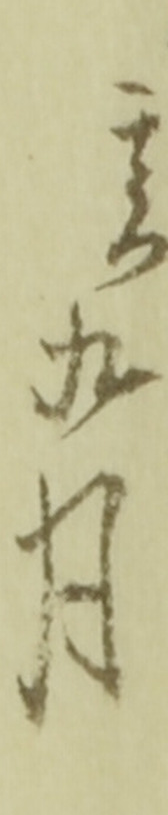寅九月
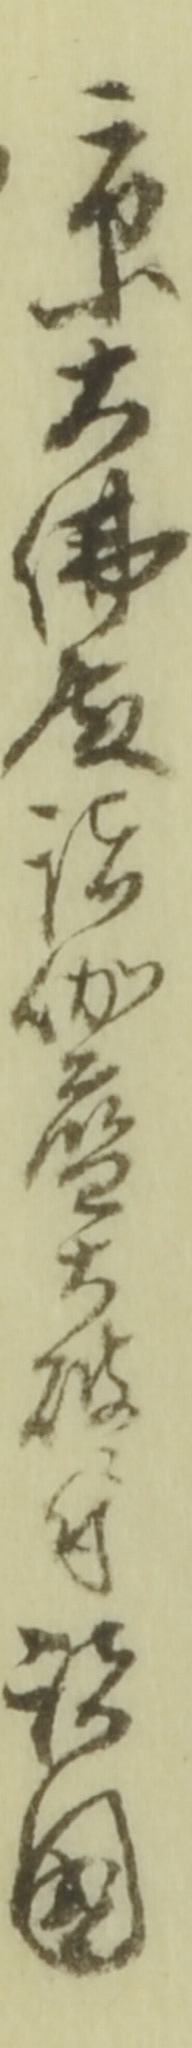京大仏殿所伽藍大破二付諸国
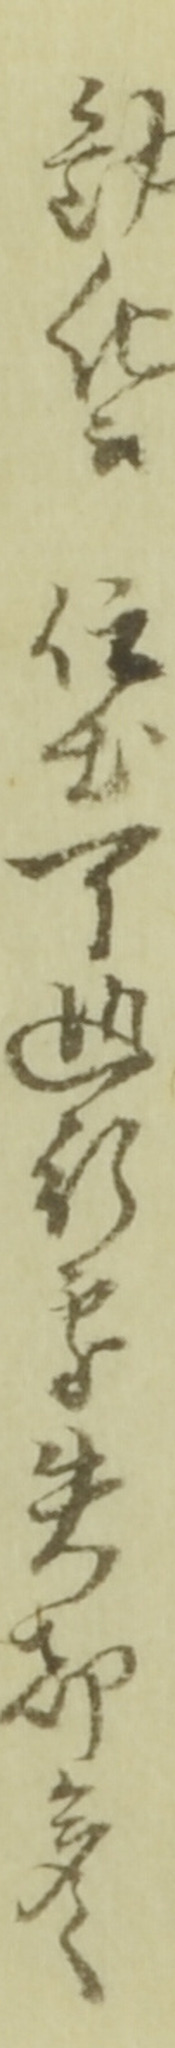勧化被仰出可遊行處失却多
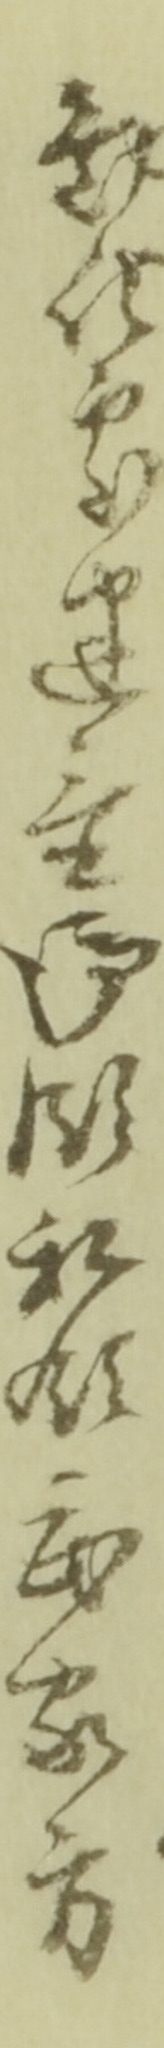勧化候處達置御領私領二茂家方
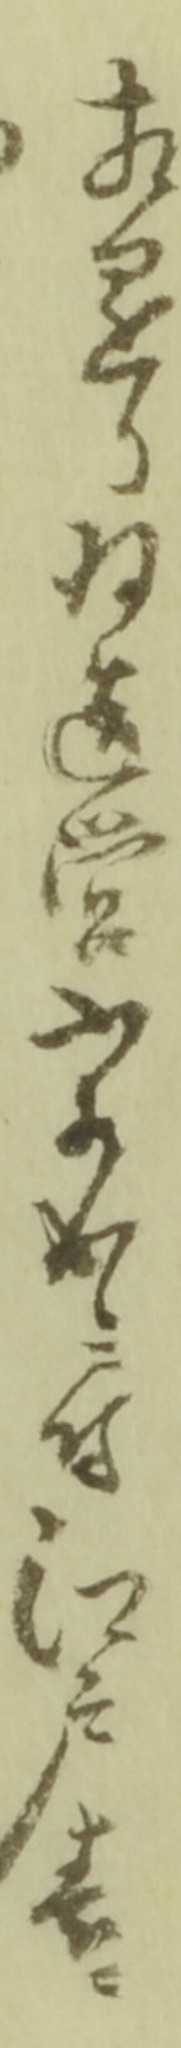相懸為造営不相成候二付江戸表二
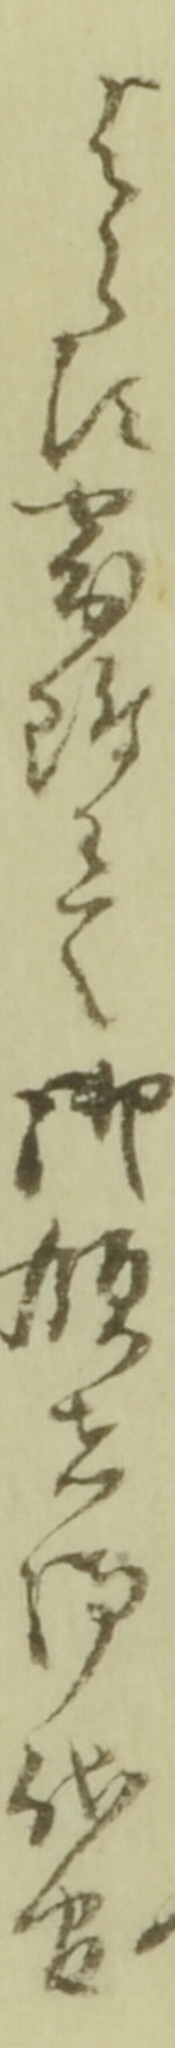よらす寄附有之御領者御代官
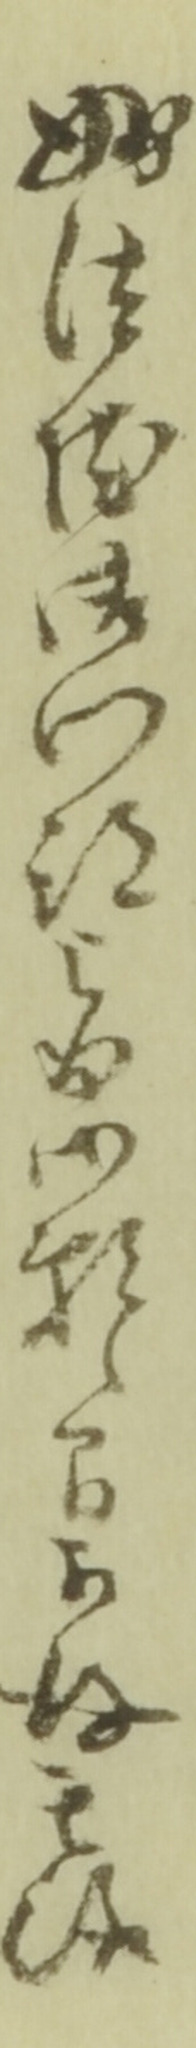妙法華御門跡被成御頼候間相得其趣
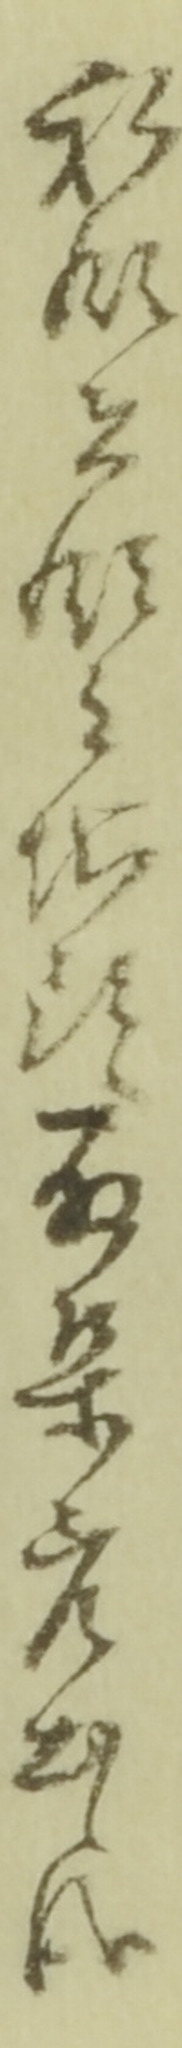私領者領主地頭へ取集差出候様
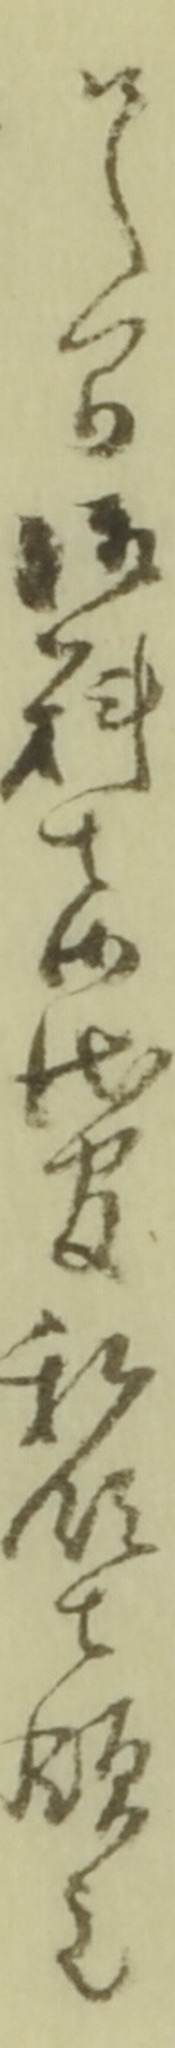候間御料者御代官私領者領主
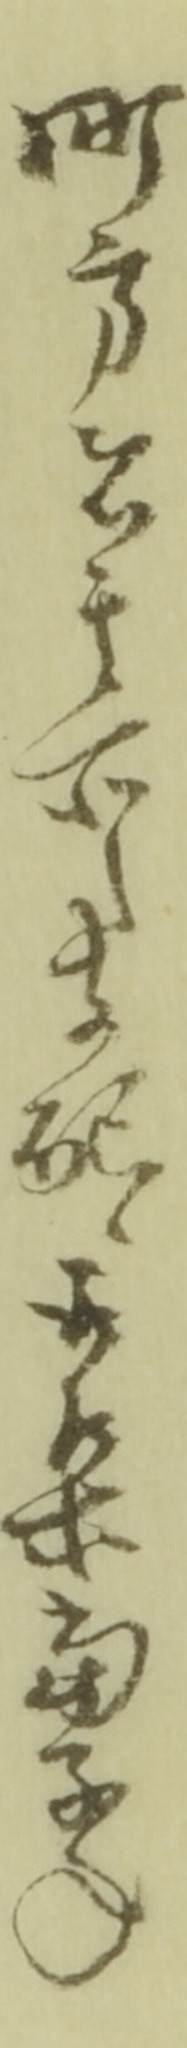町方者其所之支配へ取集当子年
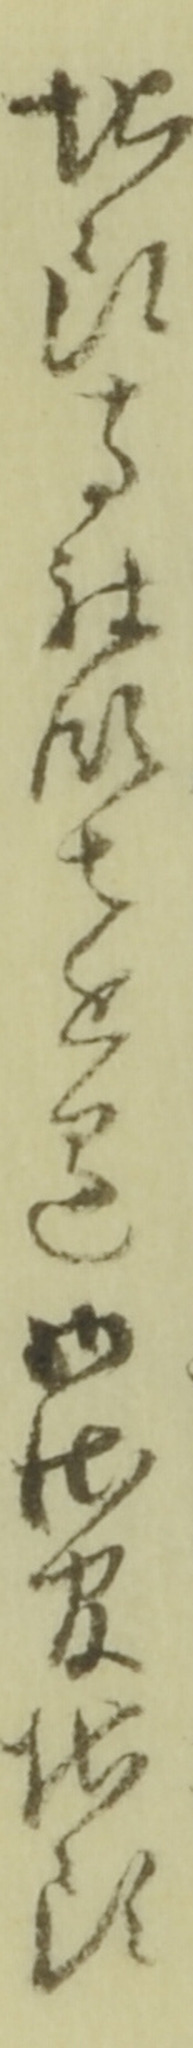地頭寺社領者近辺御代官地頭
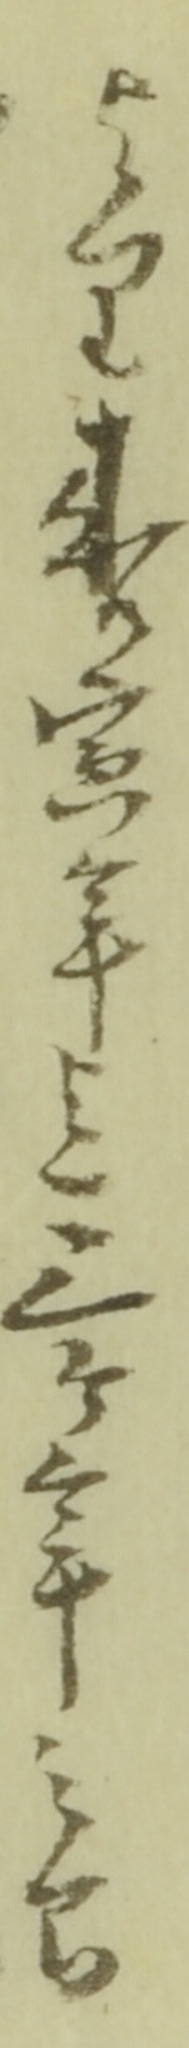より来る寅年迄三カ年之間
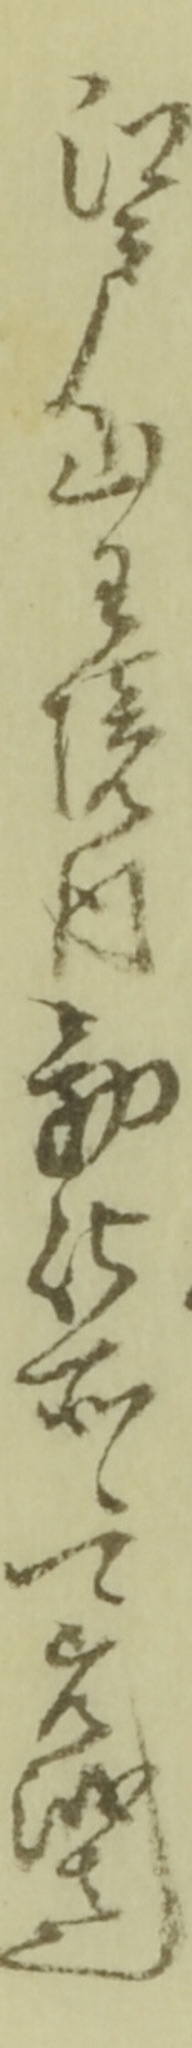江戸山王院内勧化所へ可差越者也
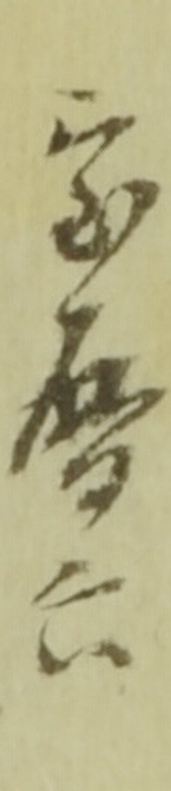宝暦六
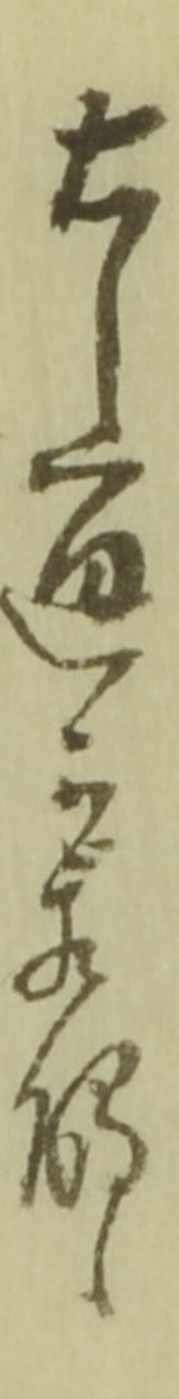右之通可相触候
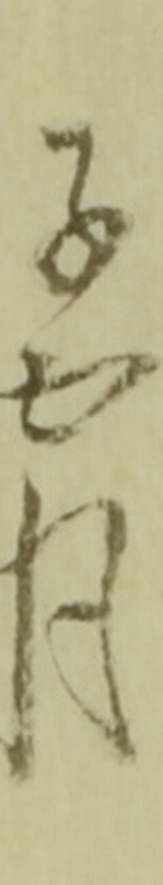子七月
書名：御公儀様御領主様御触書控
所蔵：伊那市立高遠町図書館・合同会社AMANE
